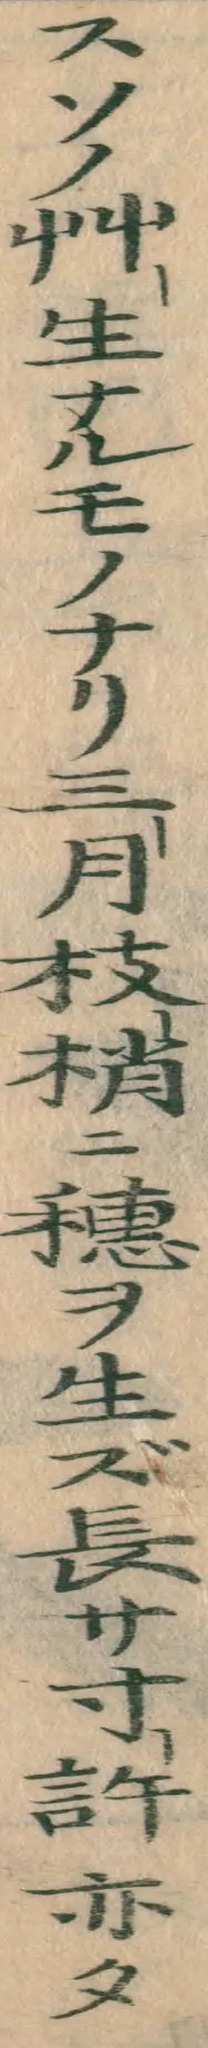スソノ艸-生ナルモノナリ三-月枝-梢ニ穂ヲ生ズ長サ寸-許亦タ
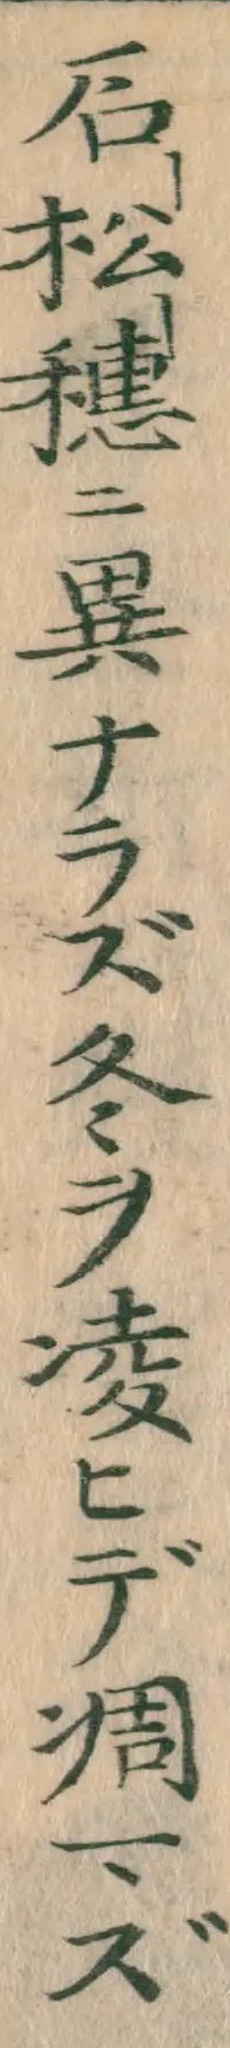石-松-穂ニ異ナラズ冬ヲ凌ヒデ凋マズ
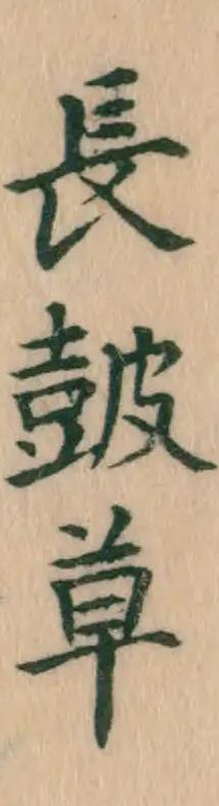長鼓草

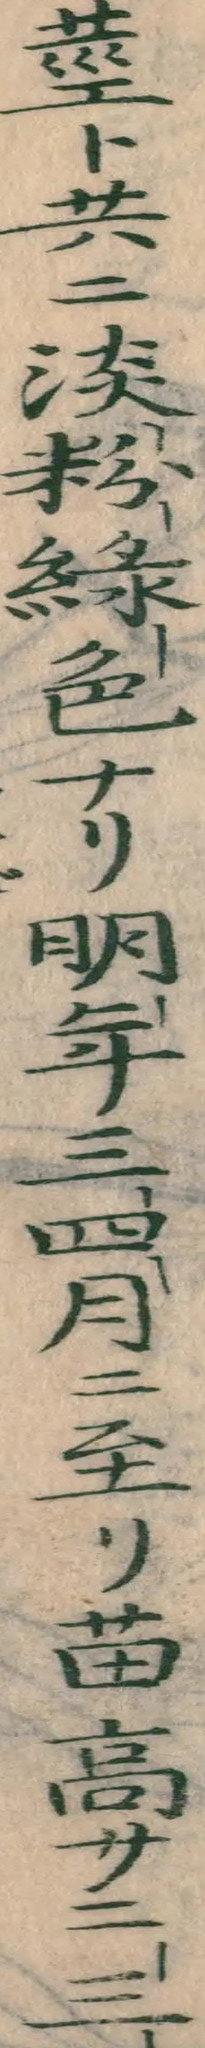茎ト共ニ淡-粉-緑-色ナリ明-年三-四-月ニ至リ苗高サ二-三-
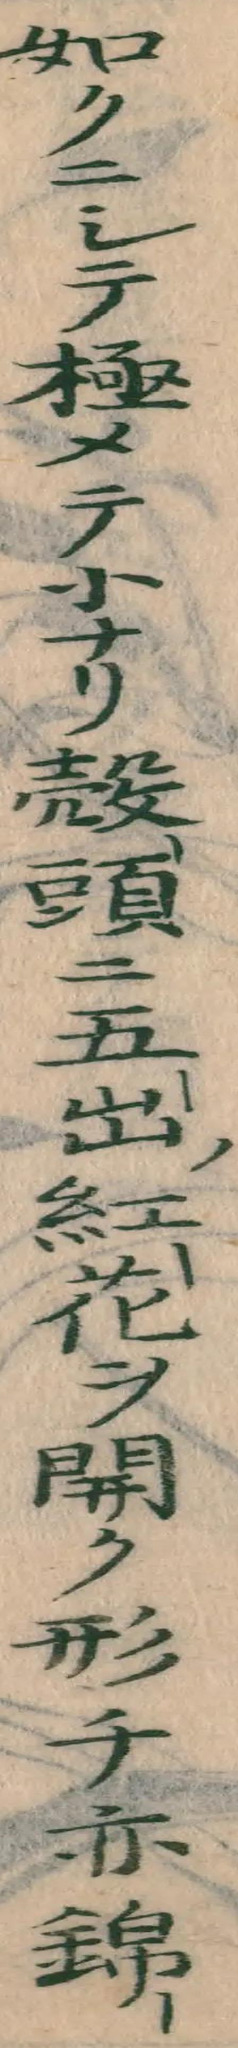如クニシテ極メテ小ナリ殻-頭ニ五-出紅-花ヲ開ク形チ亦錦-
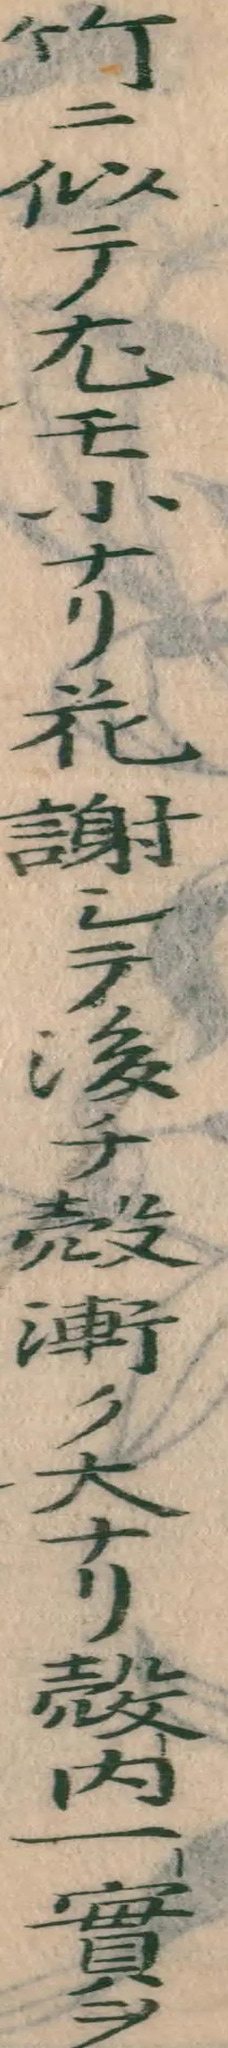竹ニ似テ尤モ小ナリ花謝シテ後チ殻漸ク大ナリ殻-内一-實ヲ
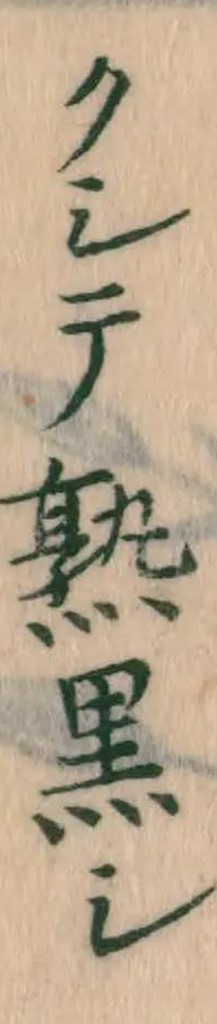クシテ熟黒シ

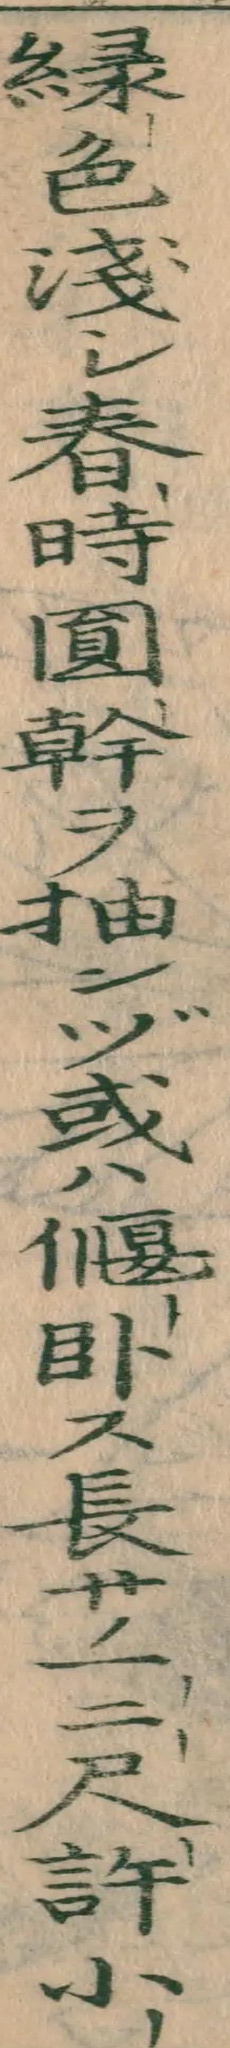緑-色浅シ春-時円-幹ヲ抽ンヅ或ハ偃-𥃨ス長サ一-二-尺-許小-
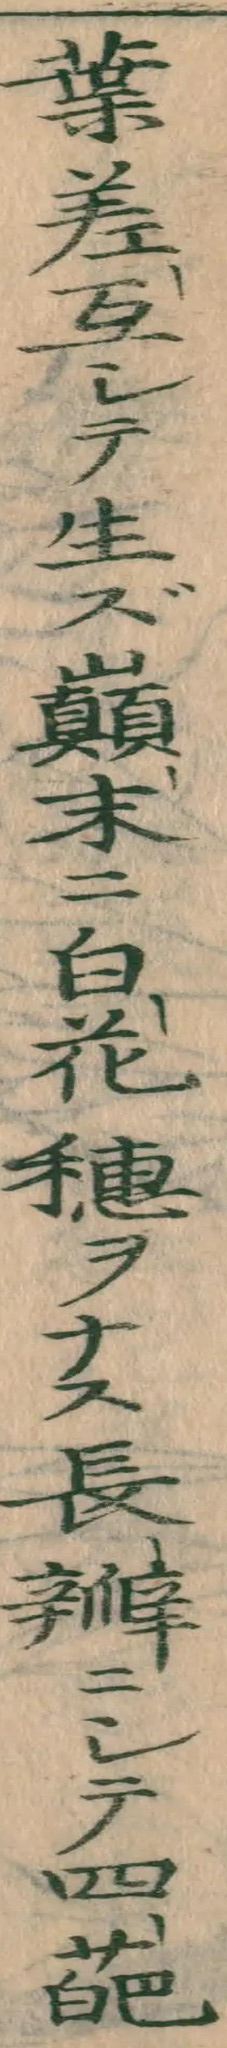葉差-互シテ生ズ巓-末ニ白-花穂ヲナス長-弁ニシテ四-葩
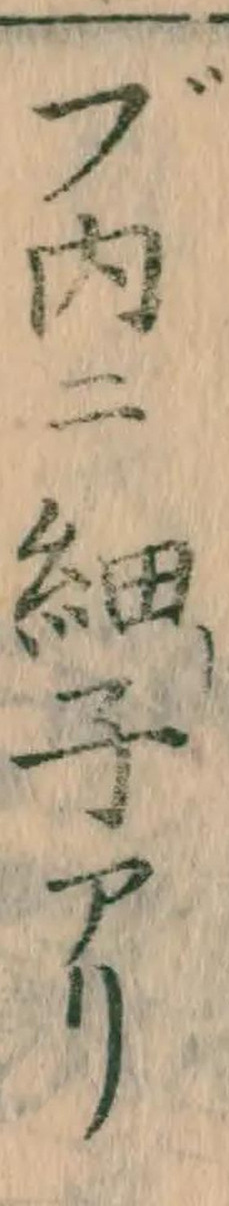ブ内ニ細-子アリ

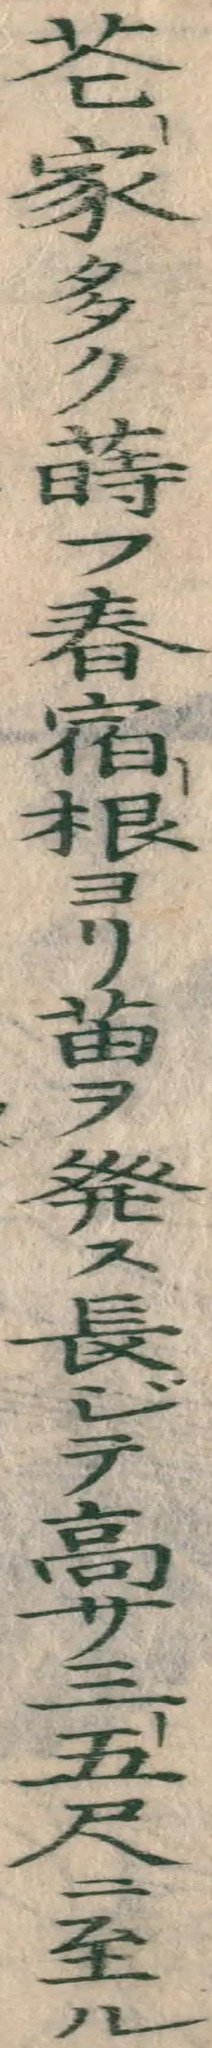花-家多ク蒔フ春宿-根ヨリ苗ヲ発ス長ジテ高サ三-五尺ニ至ル
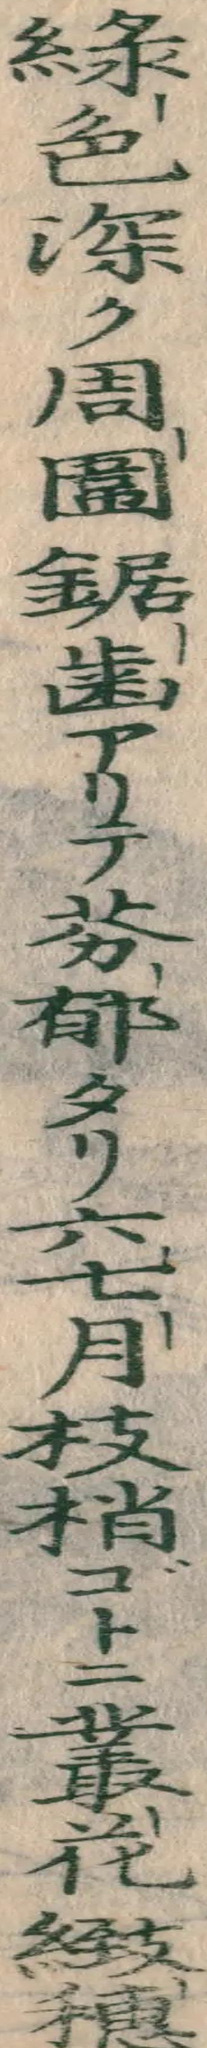緑-色深ク周-囲鋸-歯アリテ芬-郁タリ六-七-月枝梢ゴトニ叢-花緻-穂
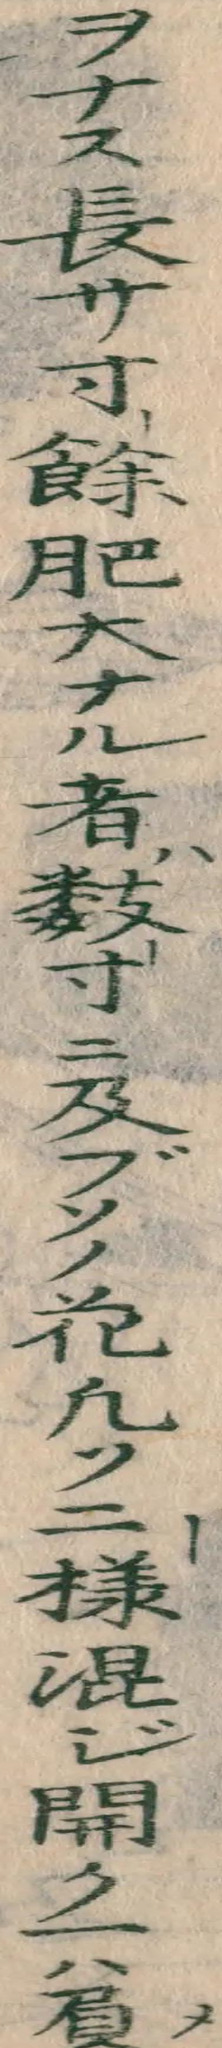ヲナス長サ寸-余肥大ナル者数-寸ニ及ブソノ花凡ソ二-様混ジ開ク一ハ屓-
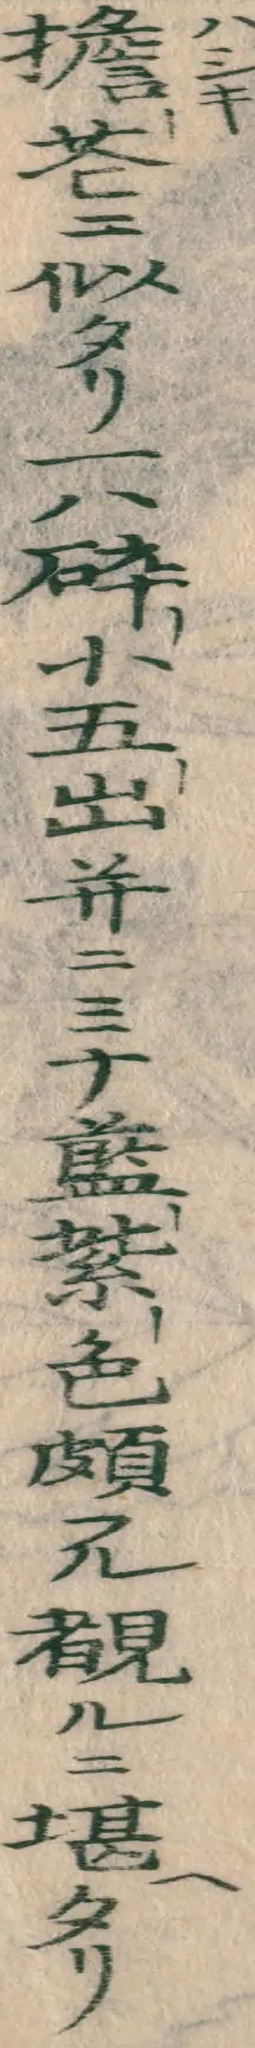担-花ニ似タリ一ハ砕-小五-出并ニミナ藍-紫-色頗フル覩ルニ堪タリ

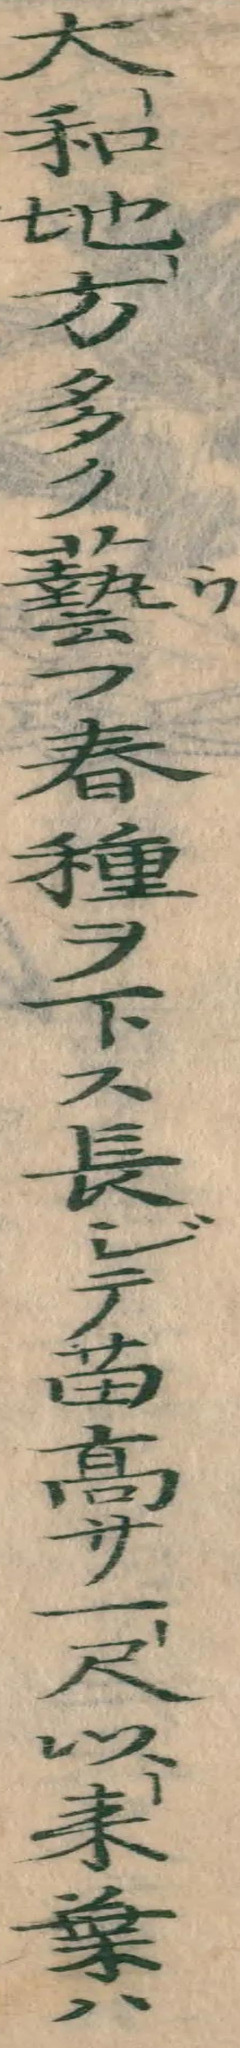大-和地-方多ク芸フ春種ヲ下ス長ジテ苗高サ一-尺以-来葉ハ
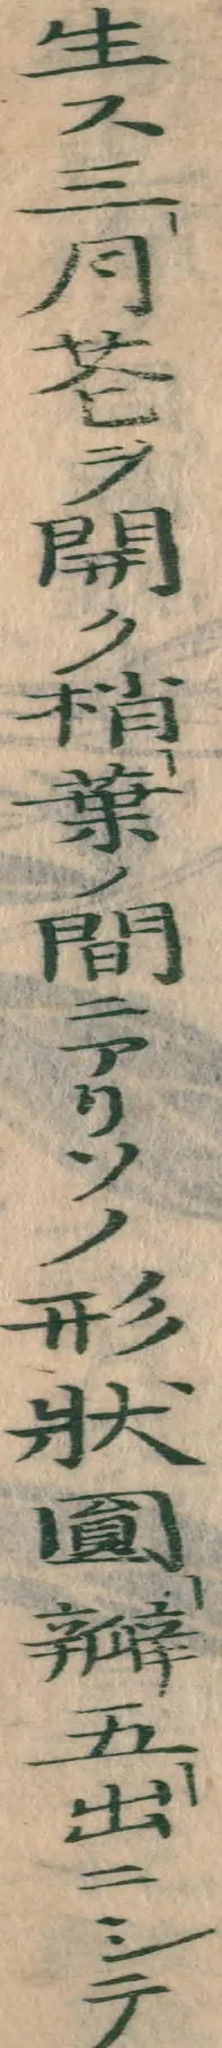生ス三-月花ヲ開ク梢-葉ノ間ニアリソノ形状円-弁五-出ニシテ
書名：花彙 草部4巻木部4巻. [1]
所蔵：国立国会図書館 National Diet Library, JAPAN
